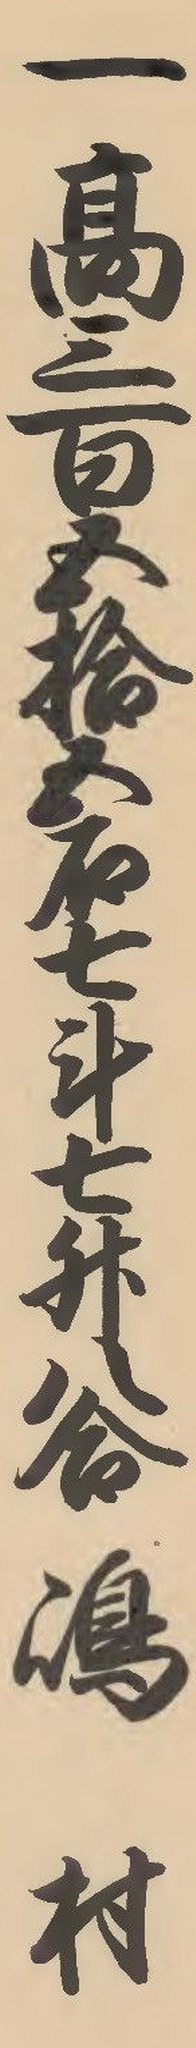一髙三百五拾五石七斗七升八合嶋村
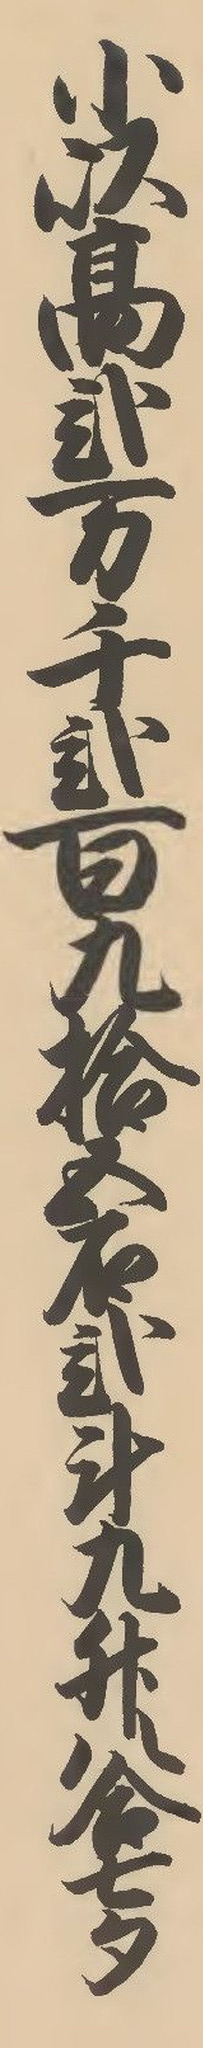小以髙二万千弐百九拾五石弐斗九升八合七夕
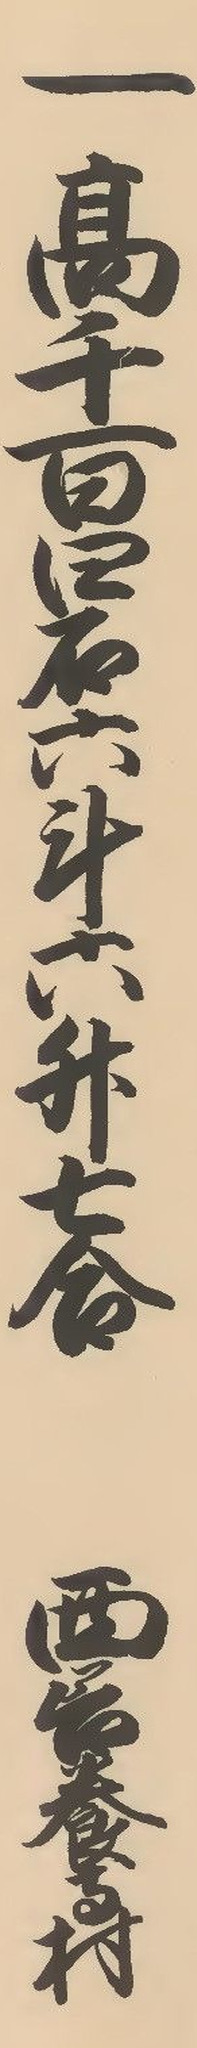一髙千百四石六斗六升七合西善養寺村
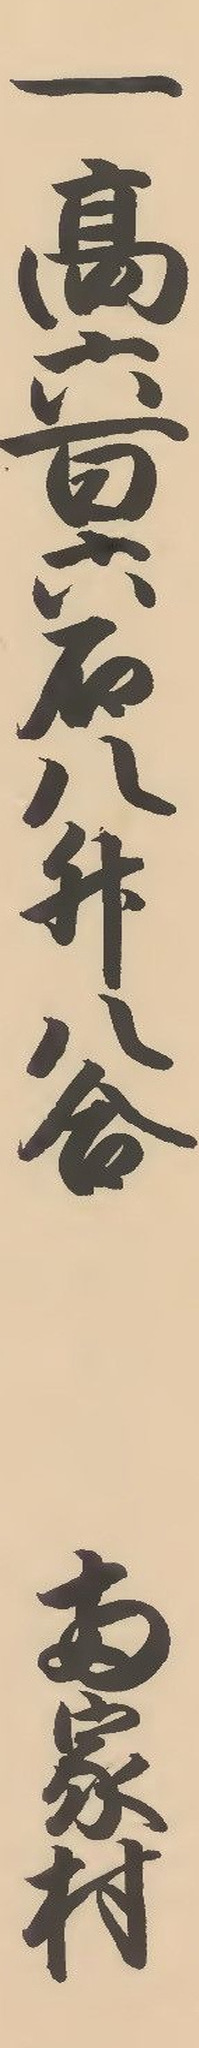一髙六百六石八升八合両家村
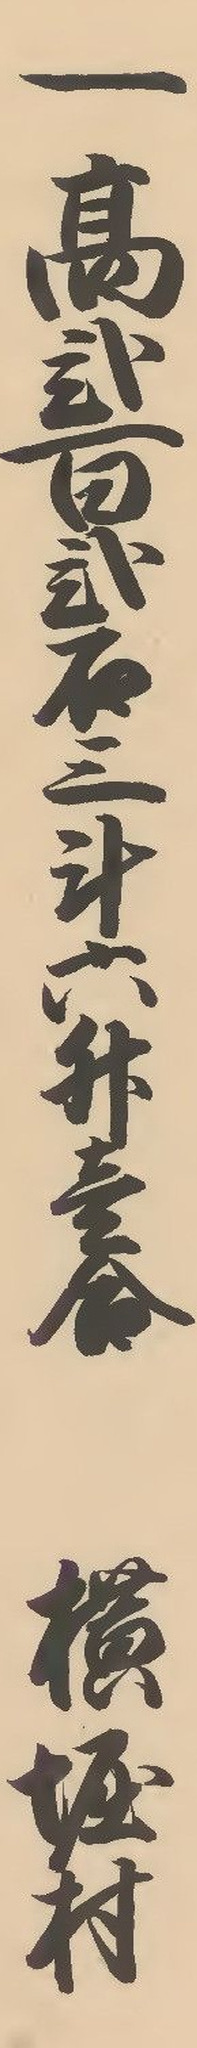一髙弐百弐石三斗六升壱合横堀村

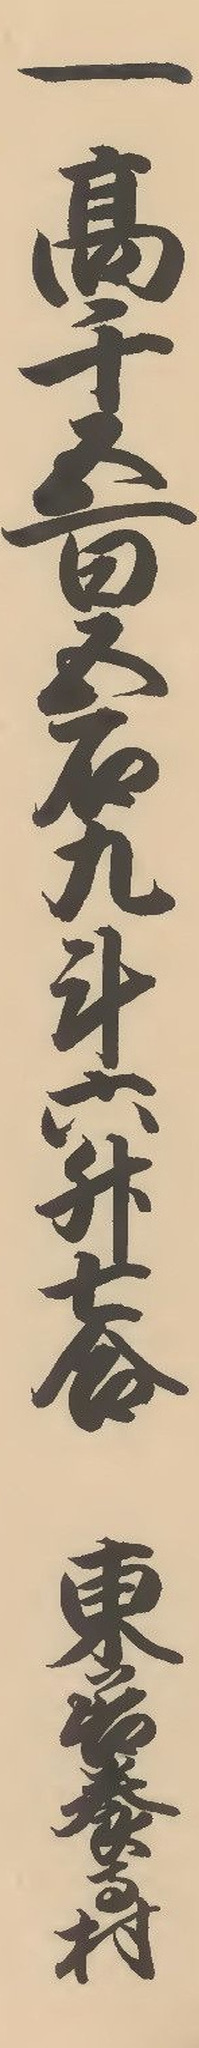一髙千五百五石九斗六升七合東善養寺村
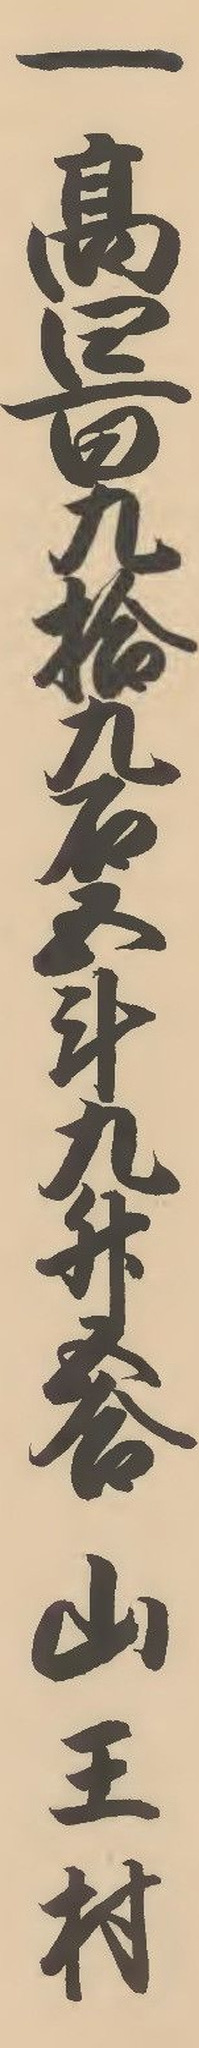一髙四百九拾九石五斗九升五合山王村
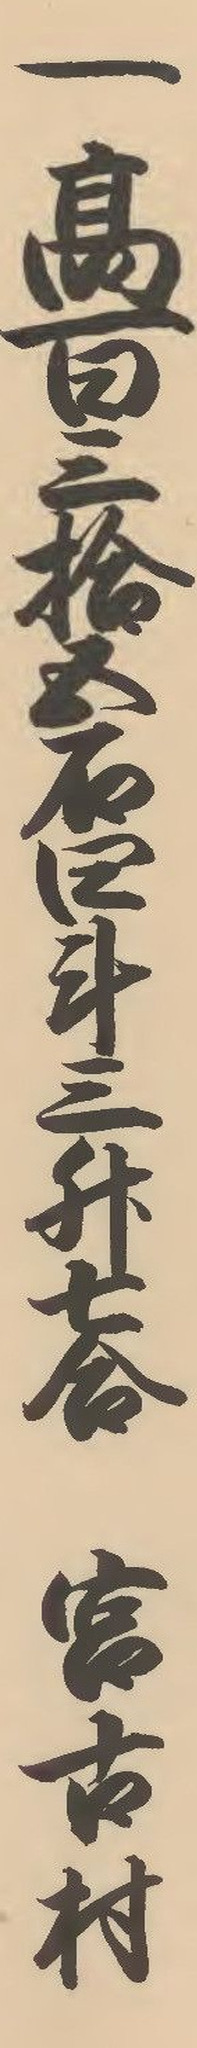一髙百三拾五石四斗三升七合宮古村
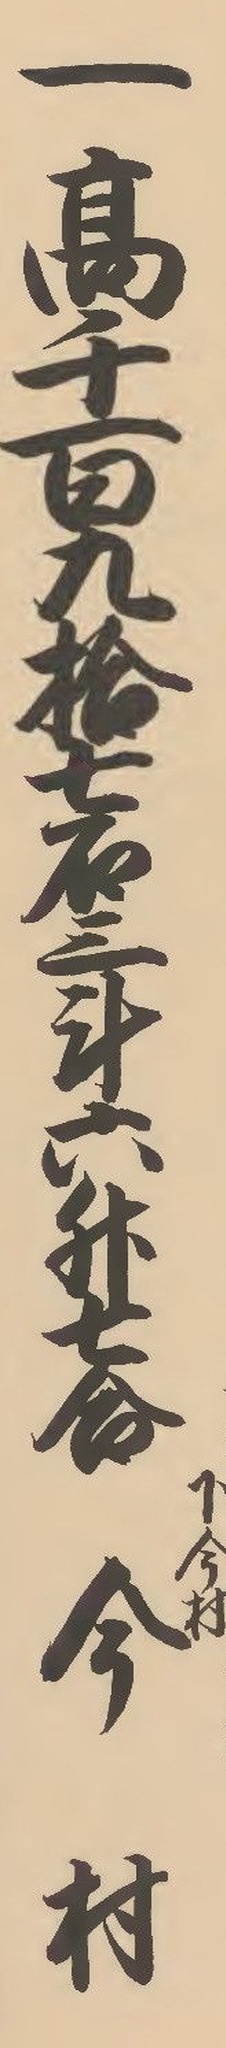一髙千百九拾七石三斗六升七合今村
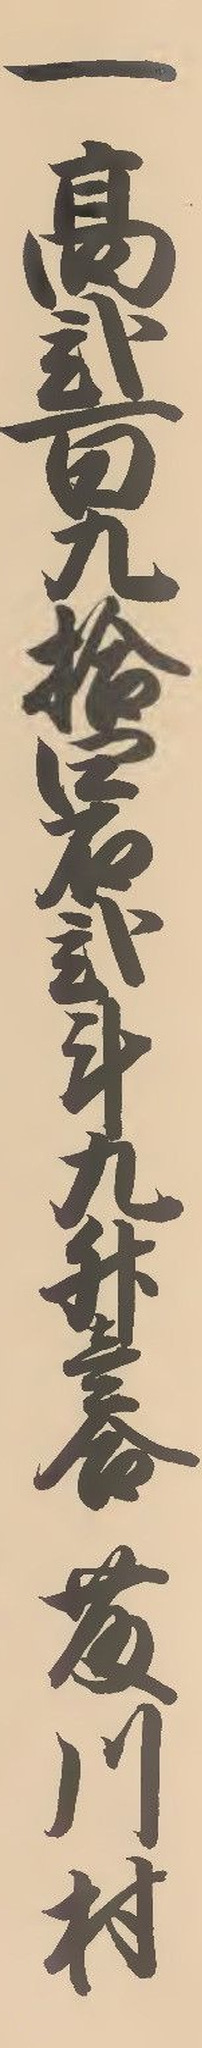一髙弐百九拾四石弐斗九升壱合藤川村
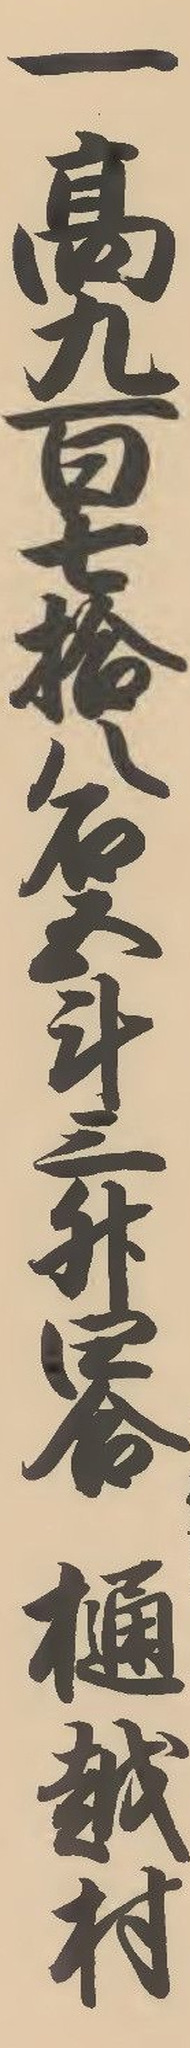一髙九百七拾八石五斗三升四合樋越村
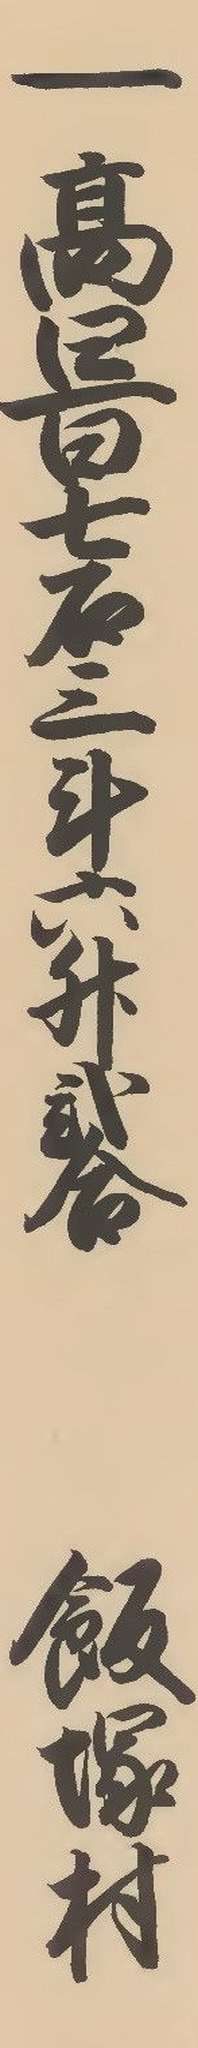一髙四百七石三斗六升弐合飯塚村
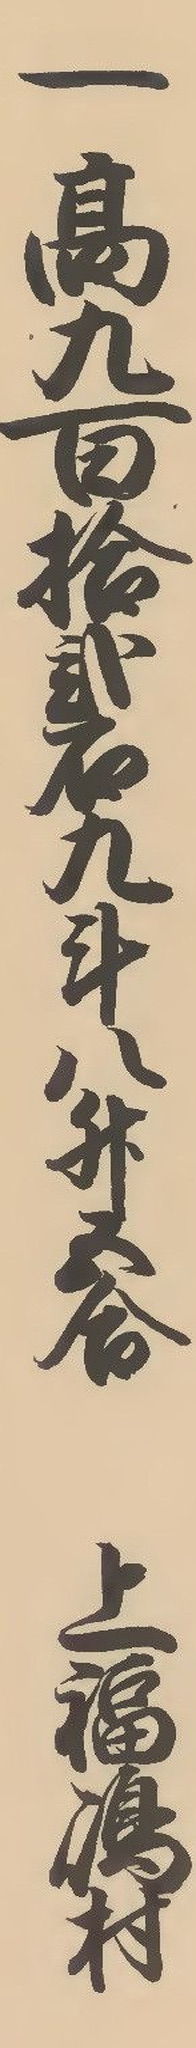一髙九百拾弐石九斗八升五合上福嶋村

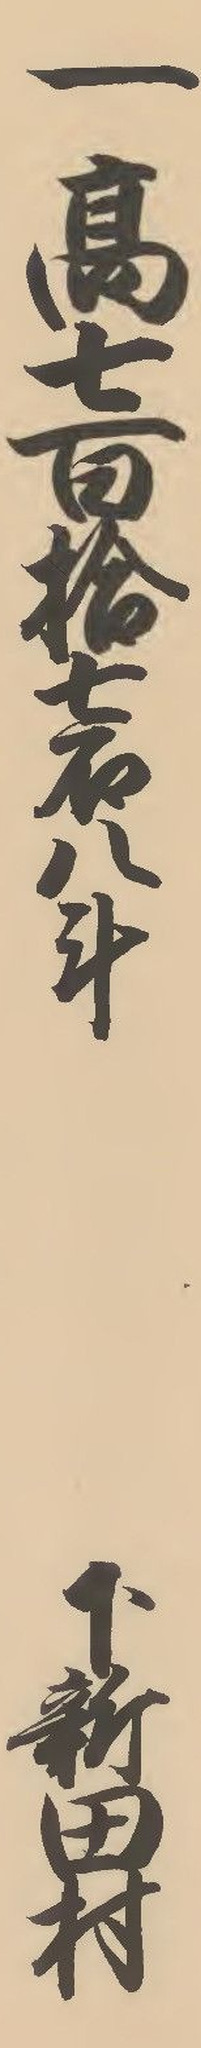一髙七百拾七石八斗下新田村
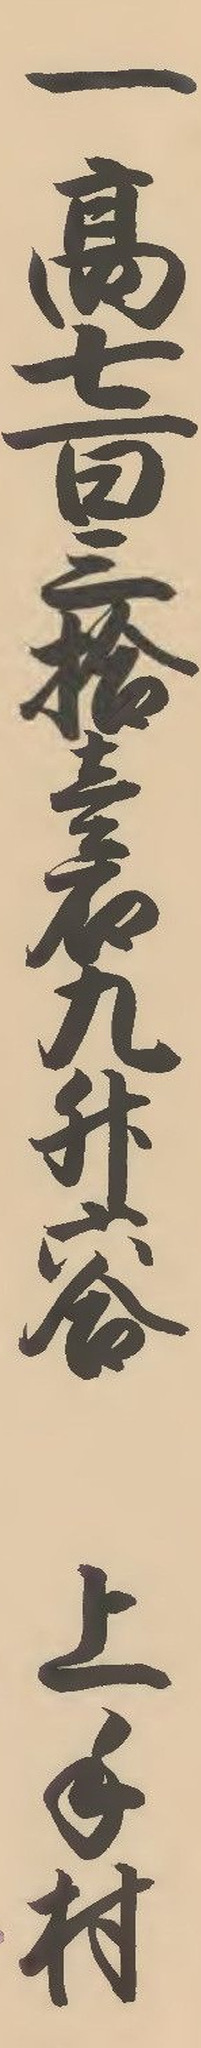一髙七百三拾壱石九升六合上手村
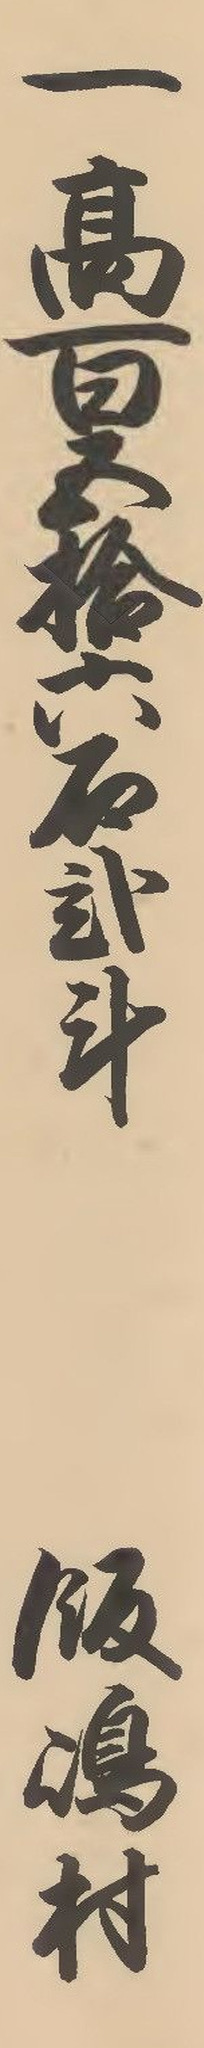一髙百五拾六石弐斗飯嶋村
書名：上野国郷帳
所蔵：国立公文書館 National Archives of Japan
